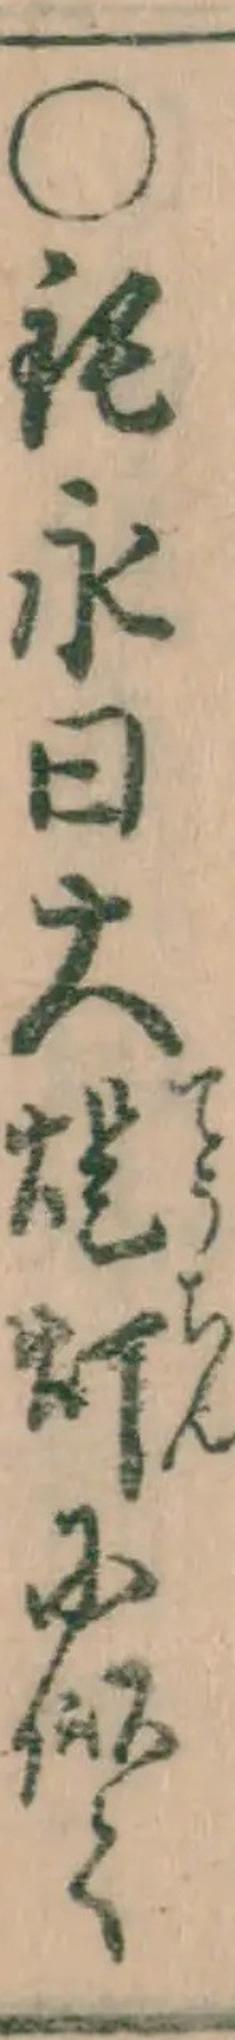○鈍永曰大提灯に似て
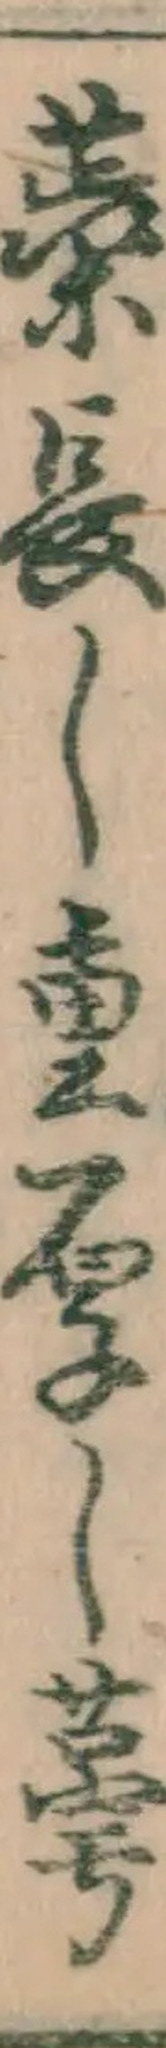蘂長し重厚し蕚
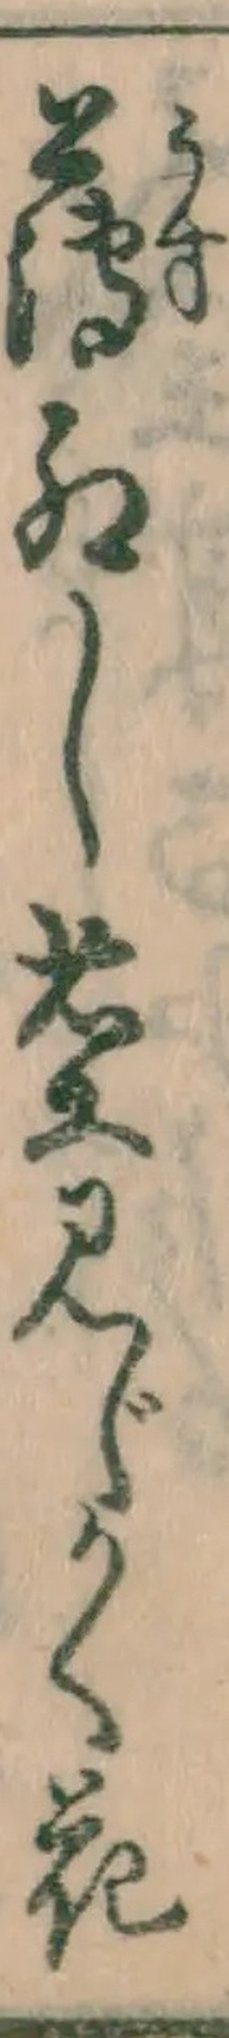薄紅し茎みじかく花
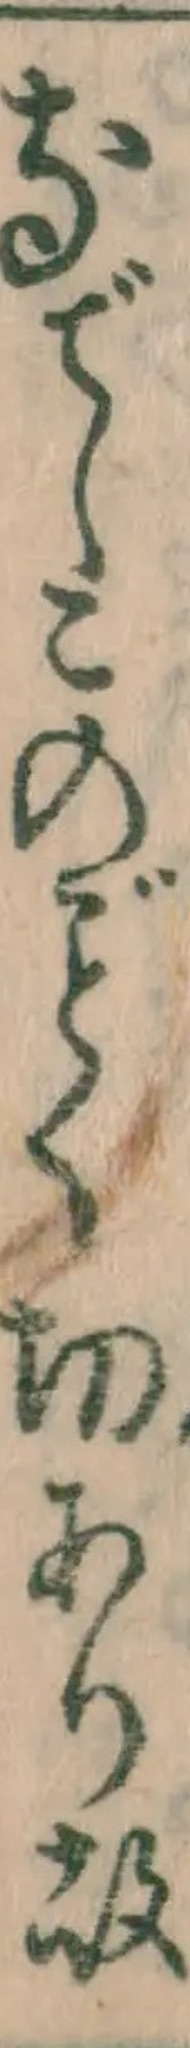なでしこのごとく切あり故
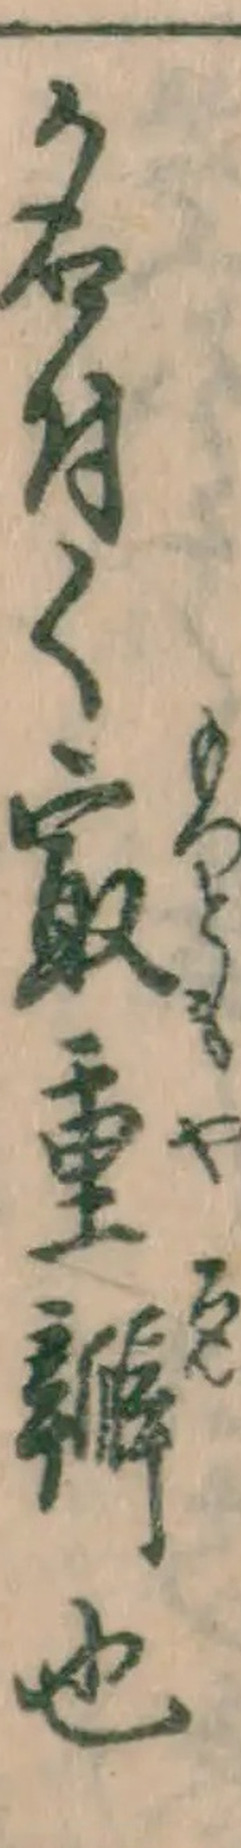名付く最重弁也

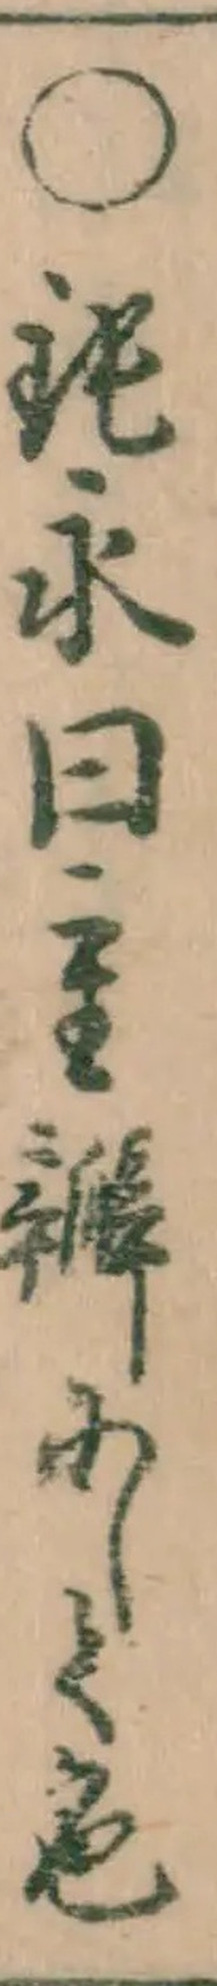○鈍永曰重弁にして色
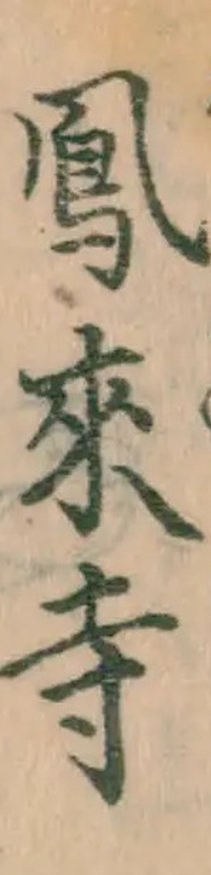鳳来寺
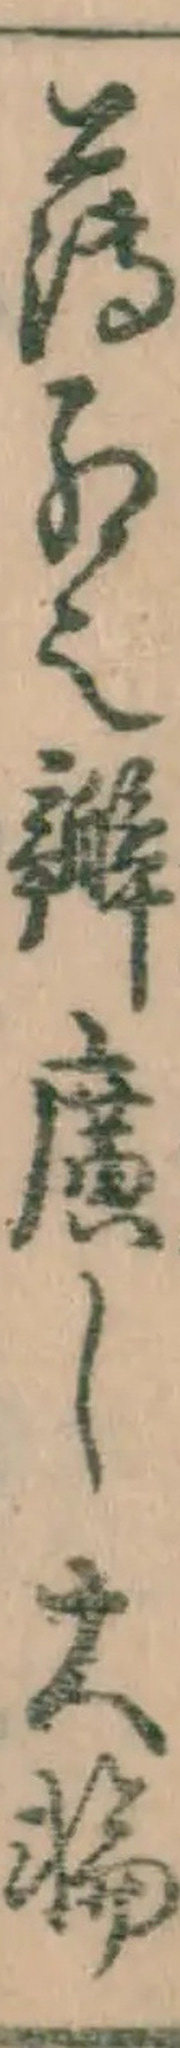薄紅也弁広し大輪
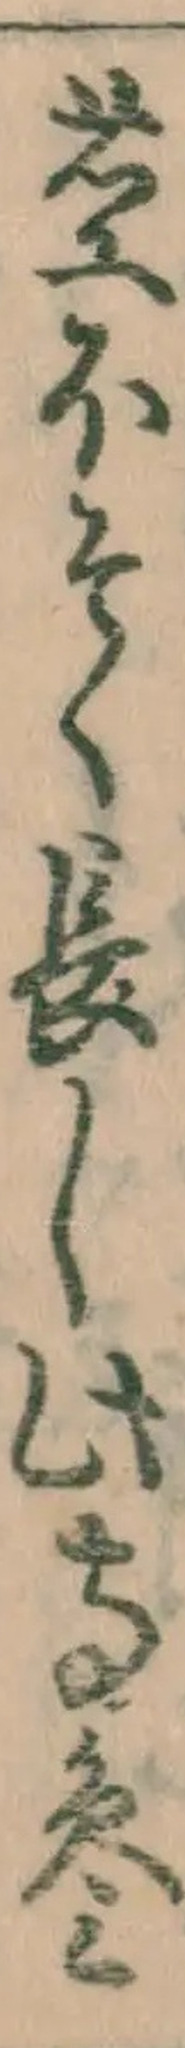茎ほそく長し此寺参
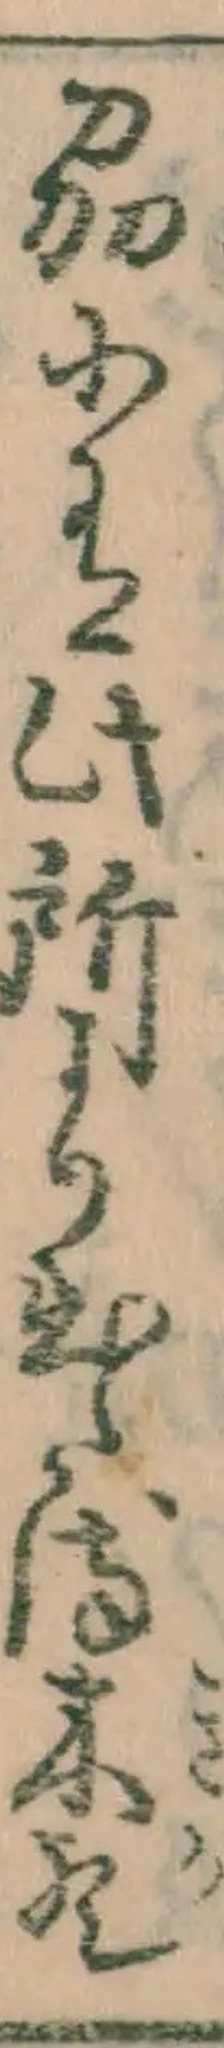州に有此所より出たる木歟
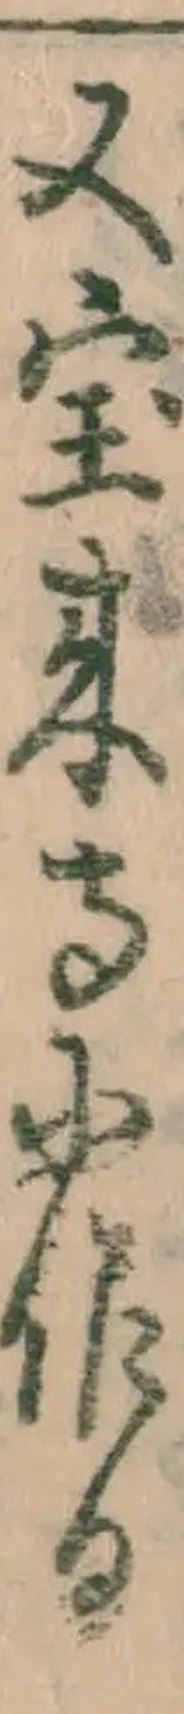又宝来寺に作る
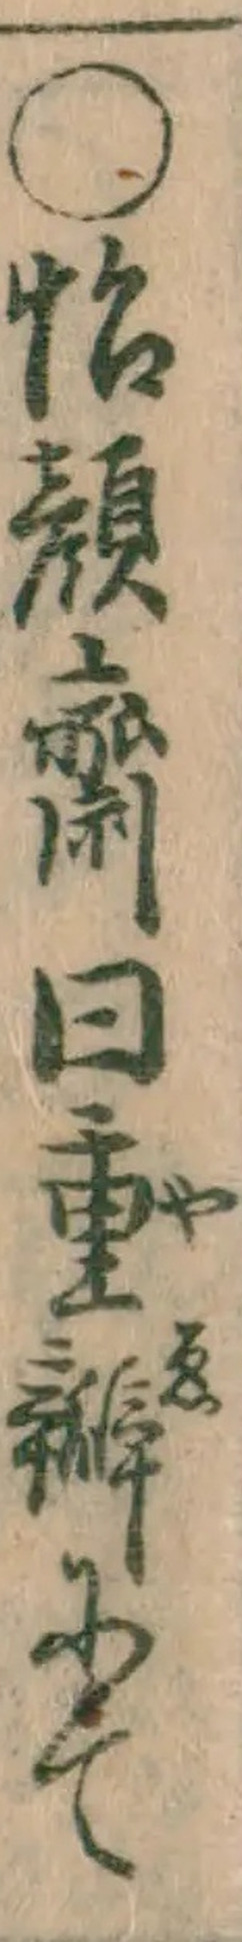○怡顔斎曰重弁にて
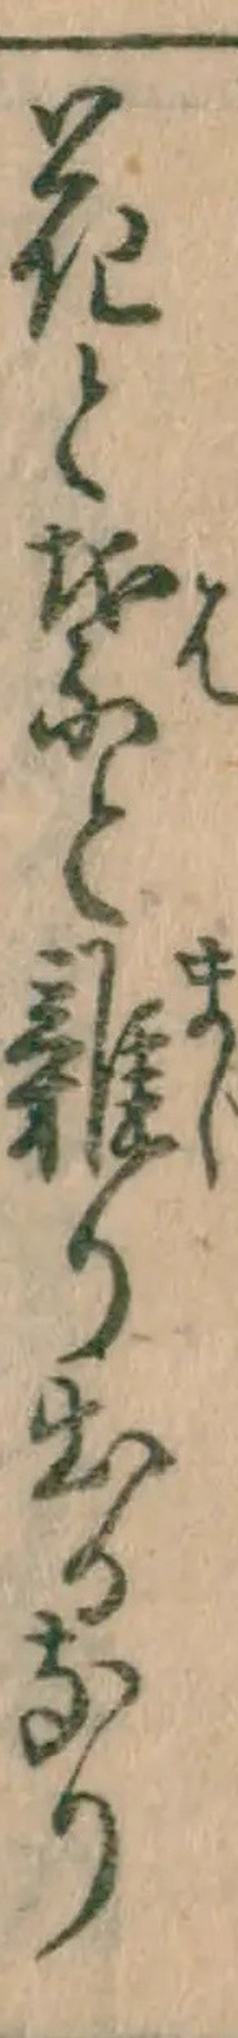花と葉と雑り出るなり
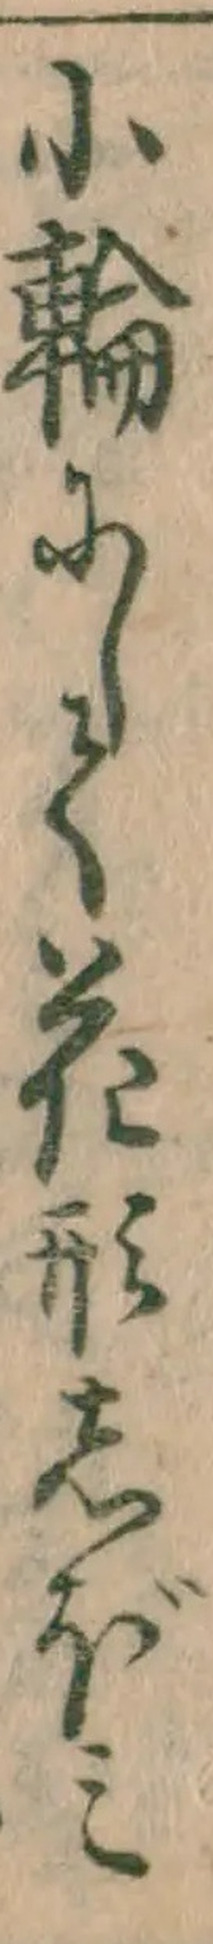小輪にして花形しぼみ
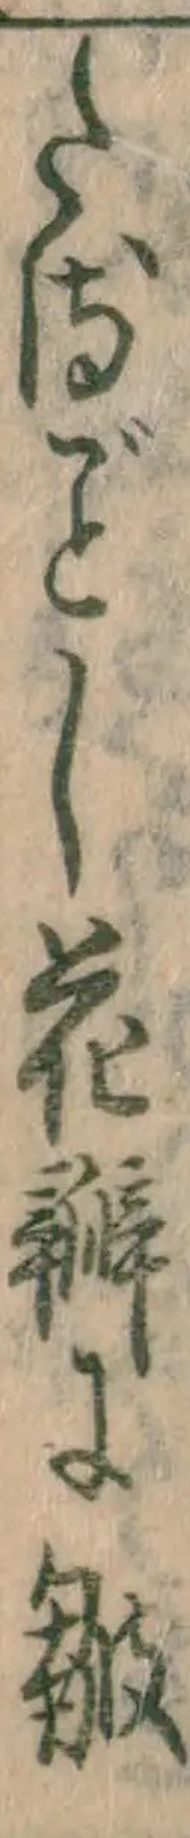たるごとし花弁に皺
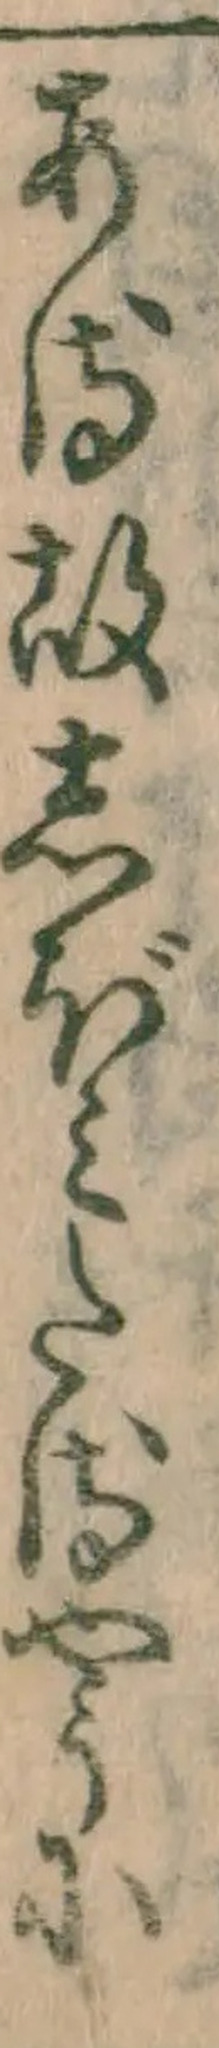ある故しぼみたるやうに
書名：怡顔齋櫻品
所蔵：国立国会図書館 National Diet Library, JAPAN
